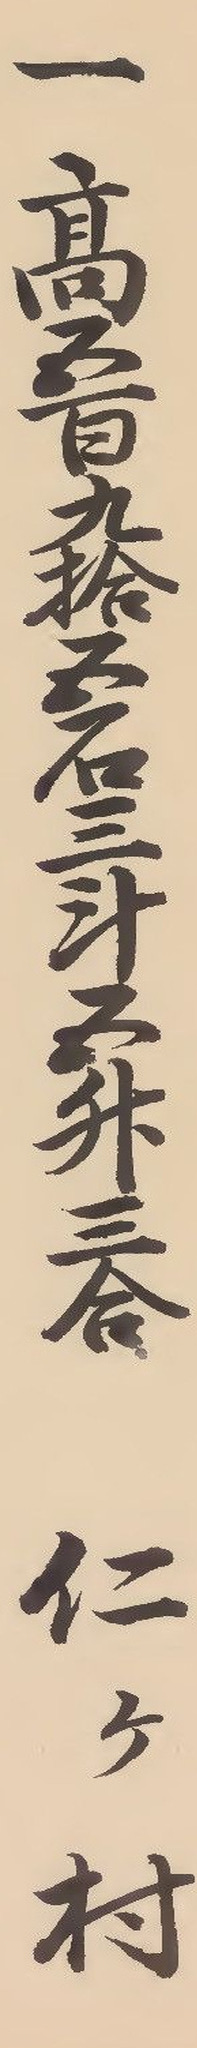一高五百九拾五石三斗五升三合仁ヶ村
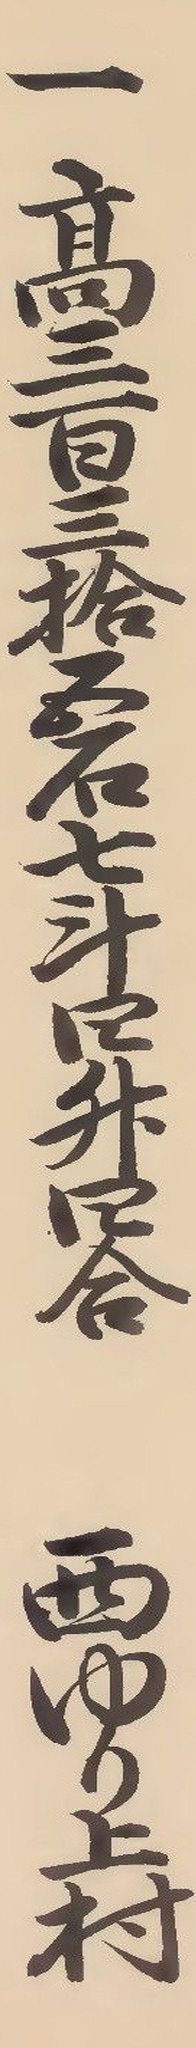一高三百三拾五石七斗四升四合西ゆり上村
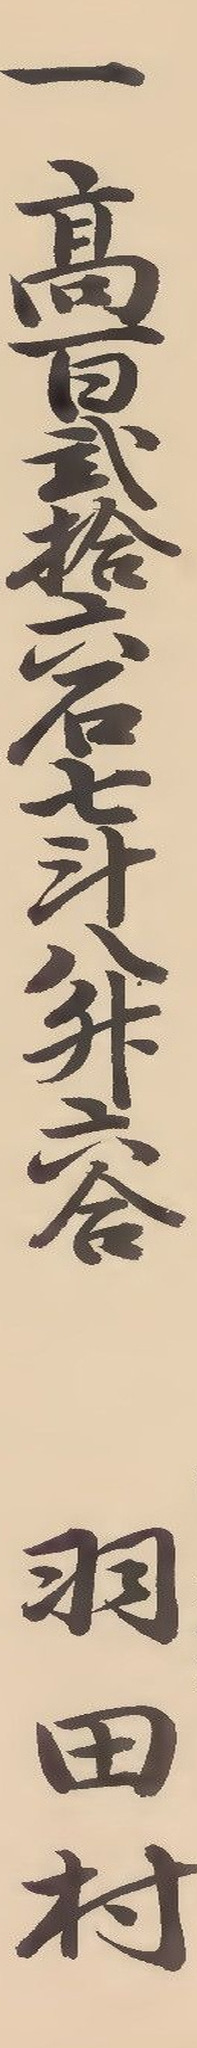一高百弐拾六石七斗八升六合羽田村
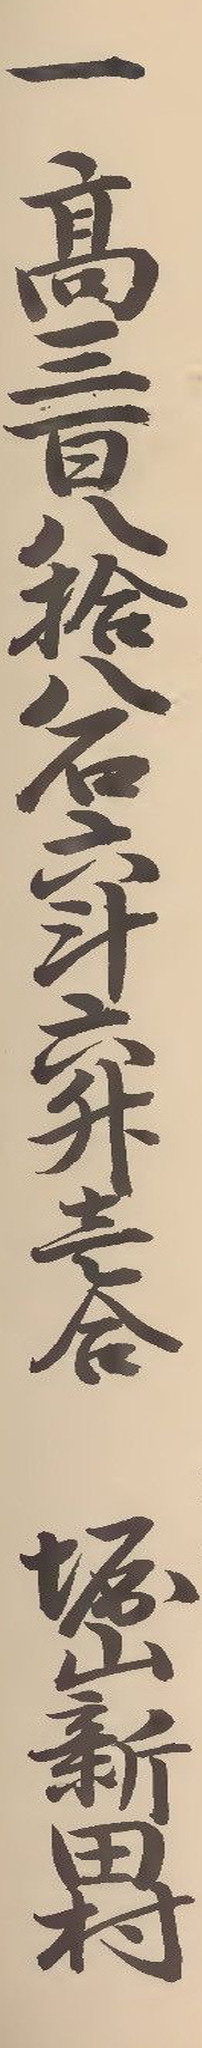一高三百八拾八石六斗六升壱合堀山新田村
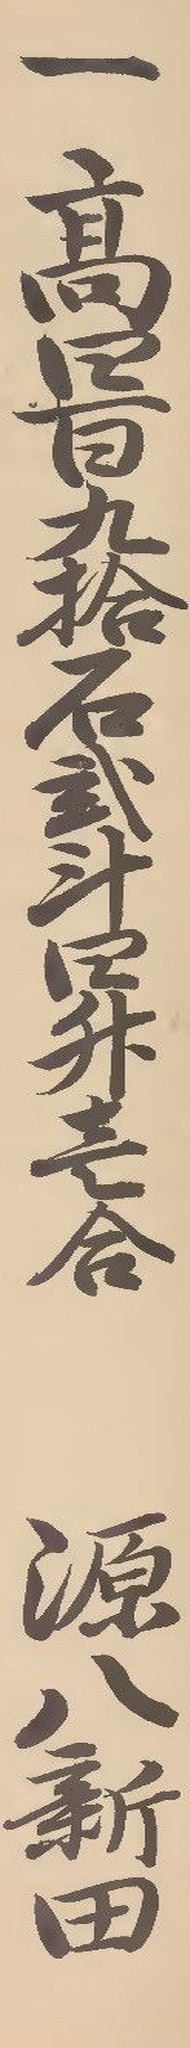一高四百九拾石弐斗四升壱合源八新田
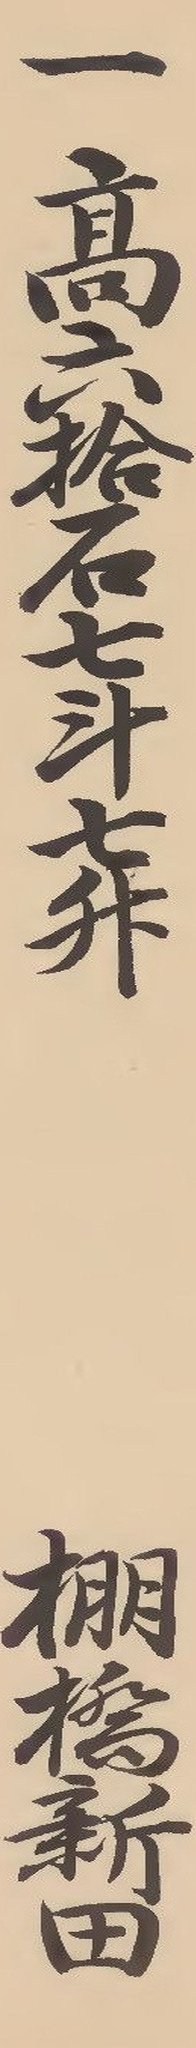一高六拾石七斗七升棚橋新田
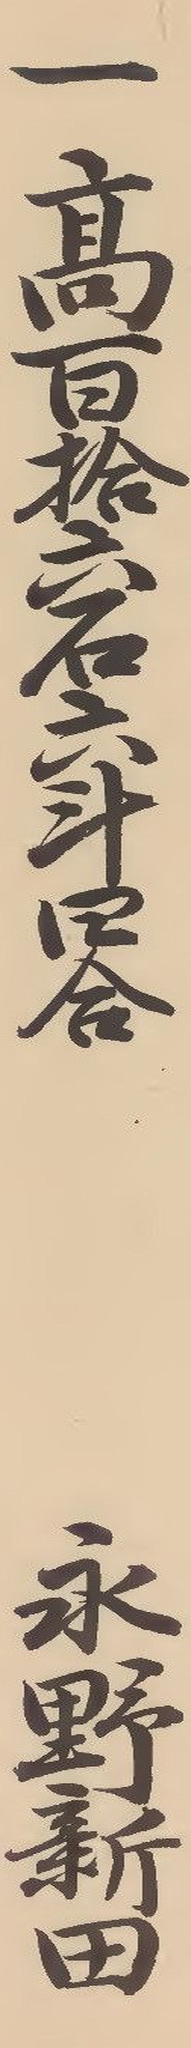一高百拾六石六斗四合永野新田
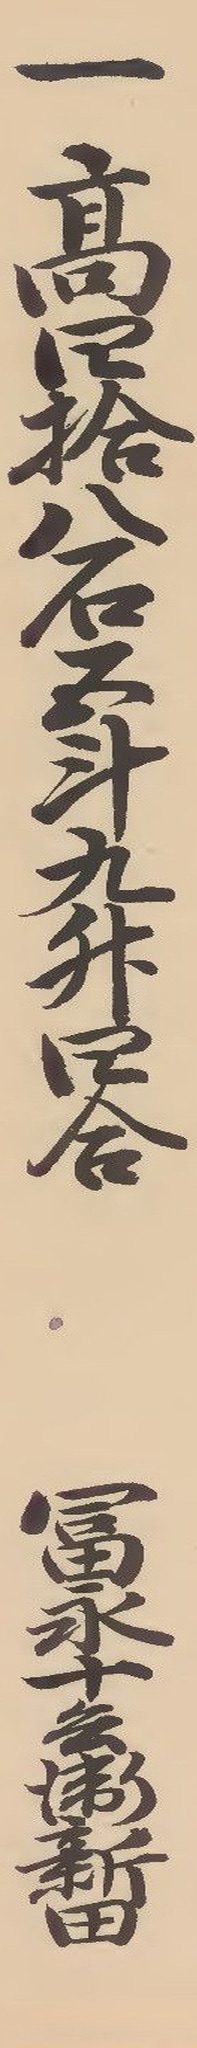一高四拾八石五斗九升四合富永十兵衛新田

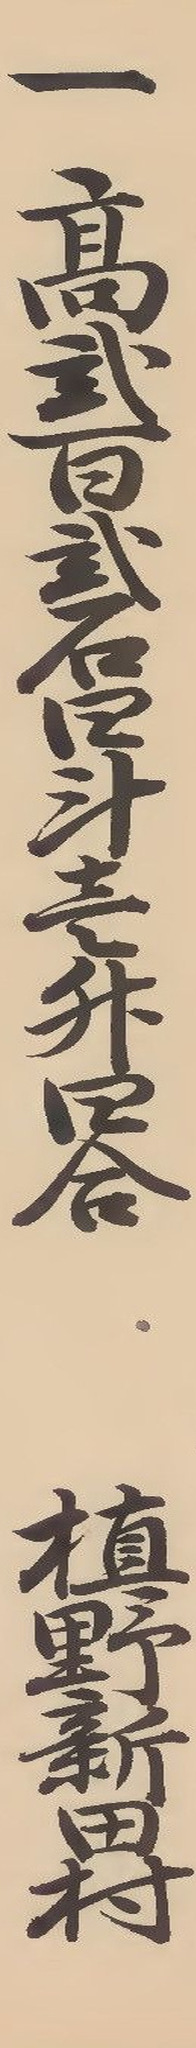一高弐百弐石四斗壱升四合植野新田村
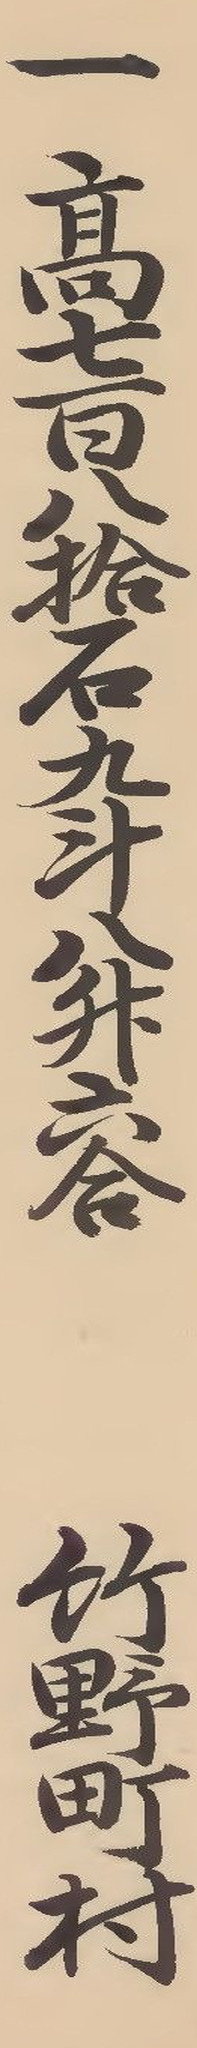一高七百八拾石九斗八升六合竹野町村
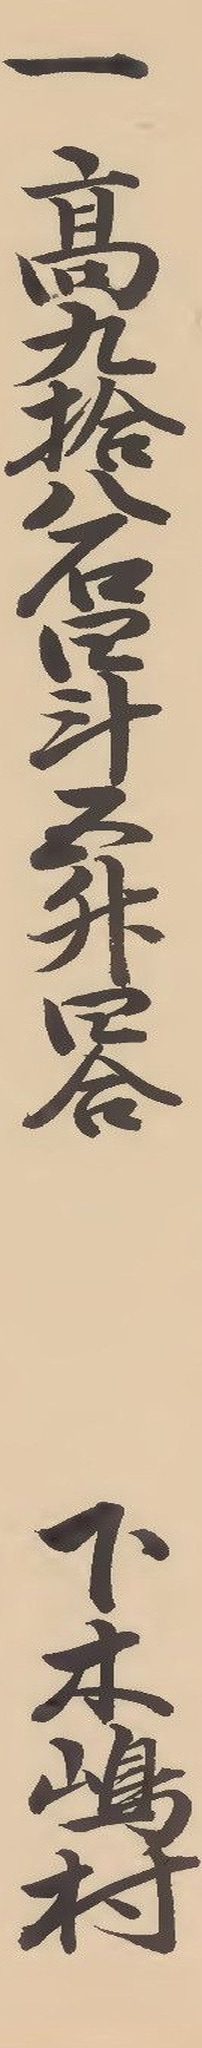一高九拾八石四斗五升四合下木島村
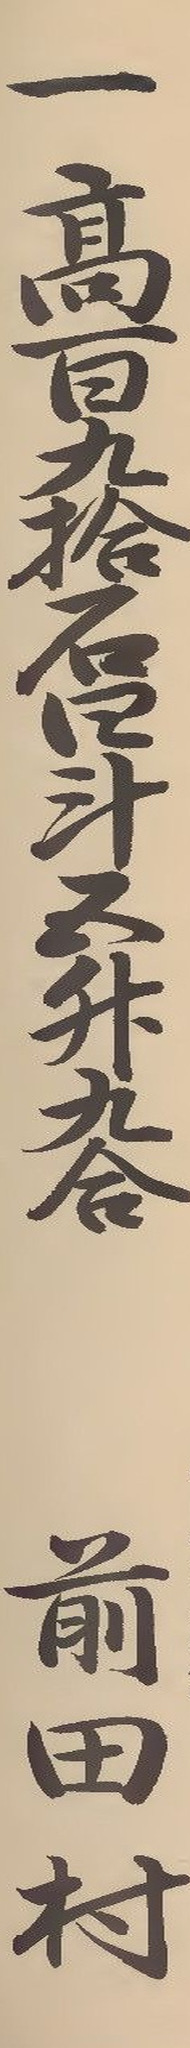一高百九拾石四斗五升九合前田村
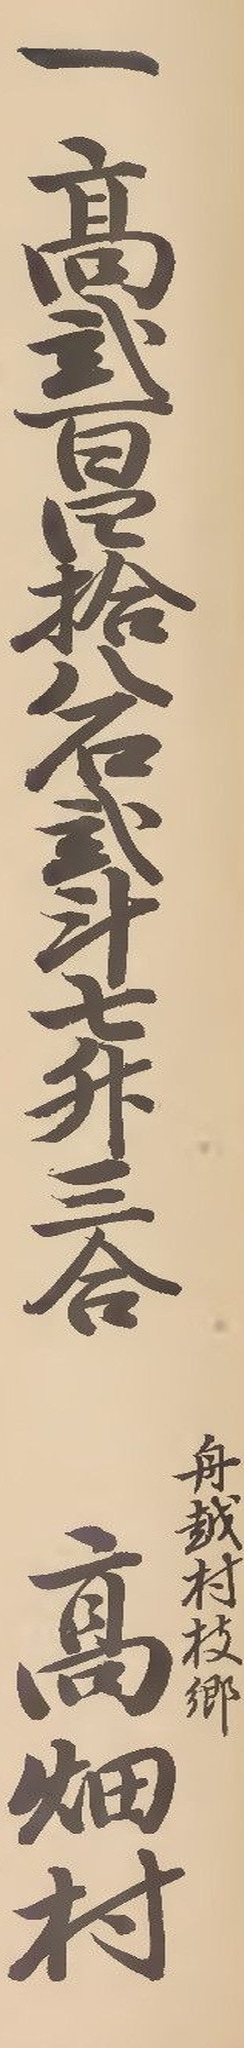一高弐百四拾八石弐斗七升三合高畑村
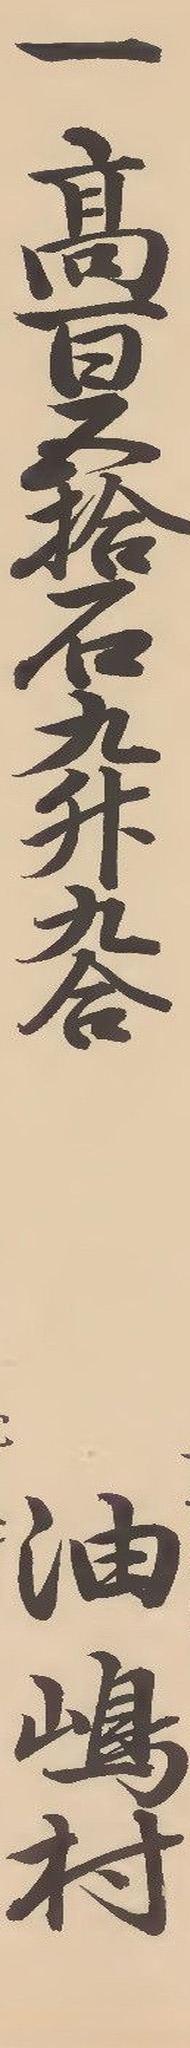一高百五拾石九升九合油島村
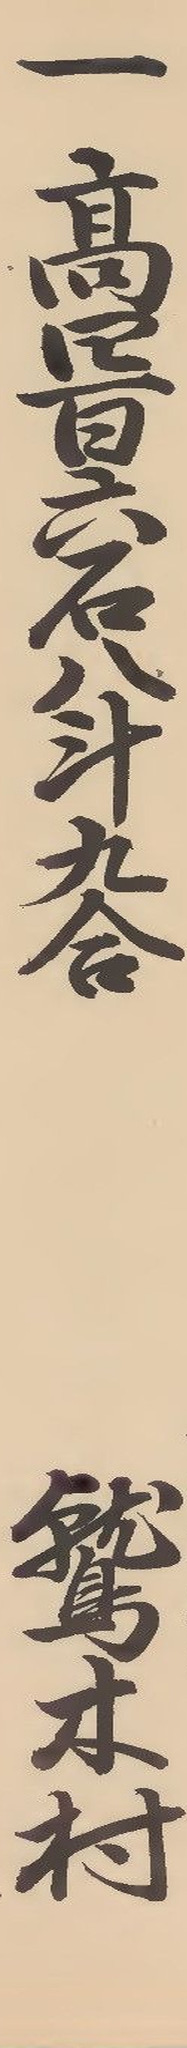一高四百六石八斗九合鷲木村
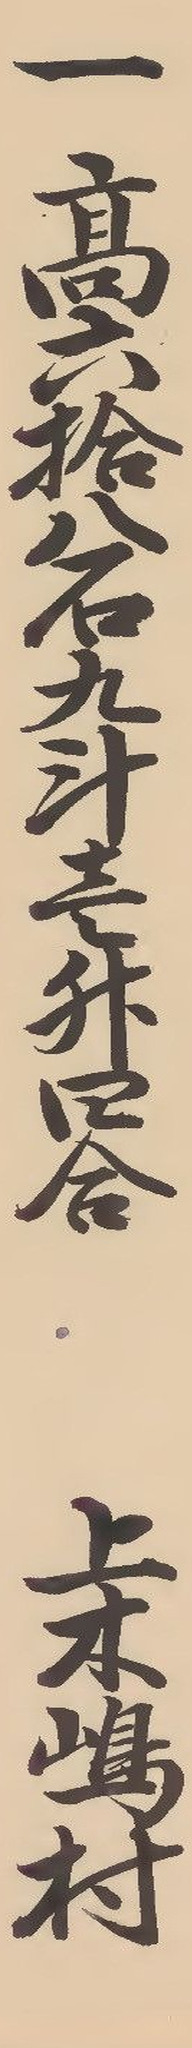一高六拾八石九斗壱升四合上木島村
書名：越後国郷帳　下
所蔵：国立公文書館 National Archives of Japan
